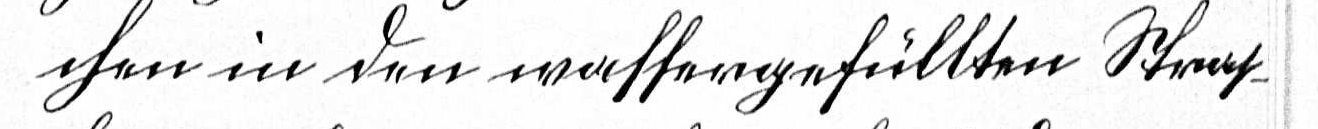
chen in den wassergefüllten Stras¬
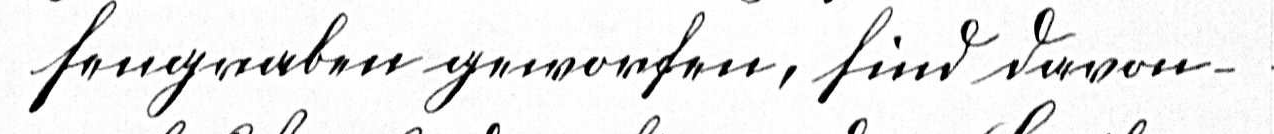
sengraben geworfen, sind davon-
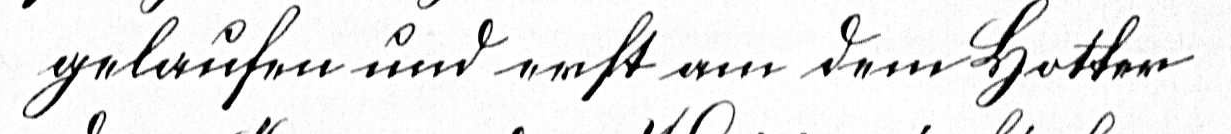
gelaufen und erst am dem Hotter
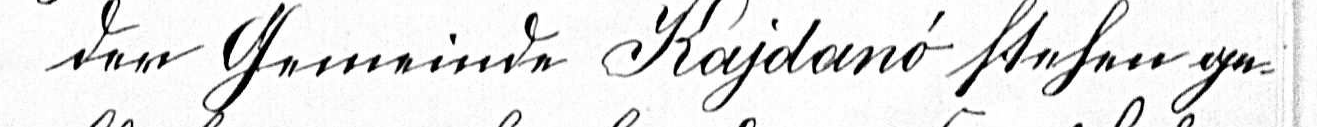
der Gemeinde Kajdanó stehen ge¬
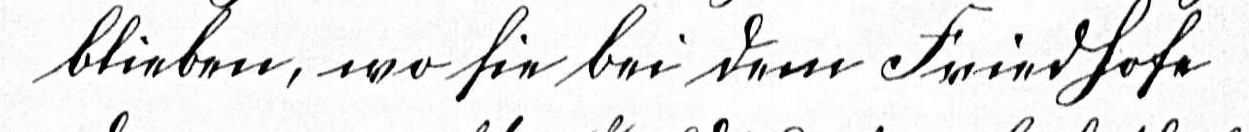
blieben, wo sie bei dem Friedhofe
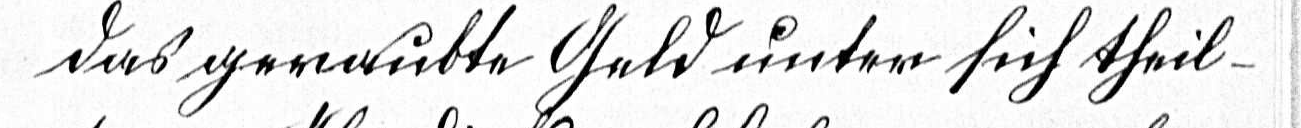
das geraubte Geld unter sich theil-
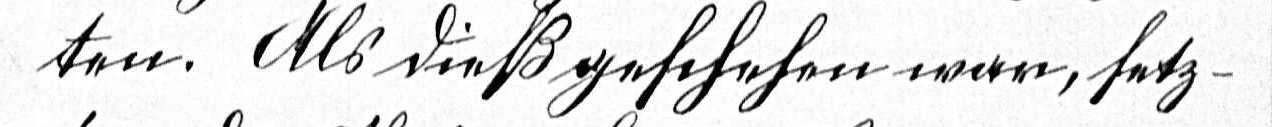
ten. Als dieß geschehen war, setz¬
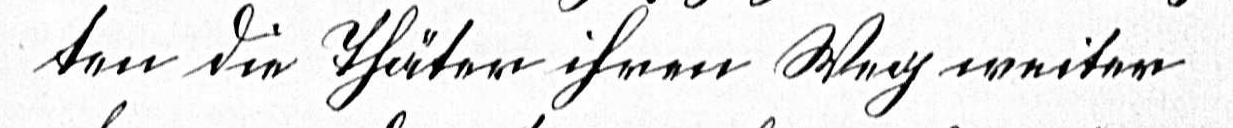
ten die Thäter ihren Weg weiter
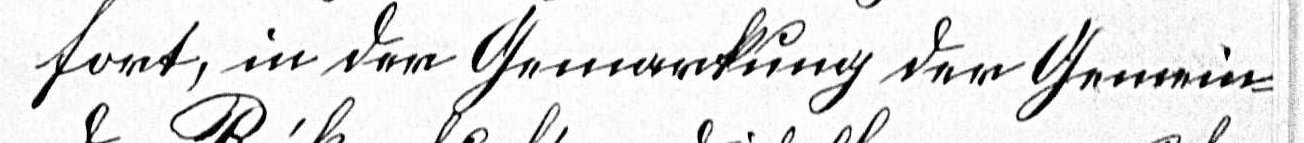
fort, in der Gemarkung der Gemein¬
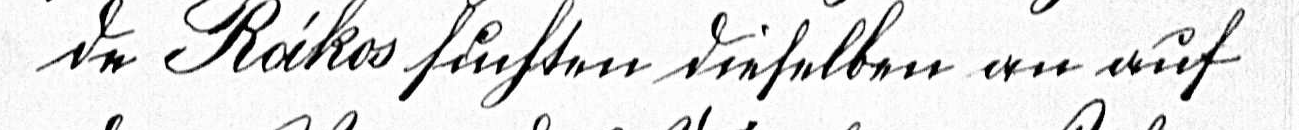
de Rákos suchten dieselben an auf
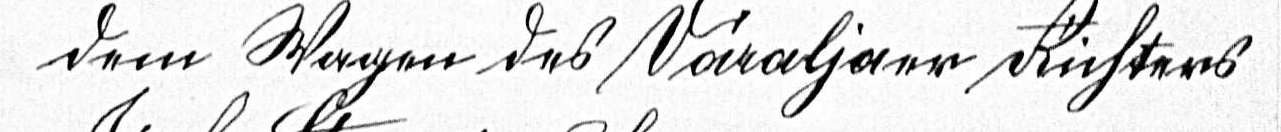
dem Wagen des Váraljaer Richters
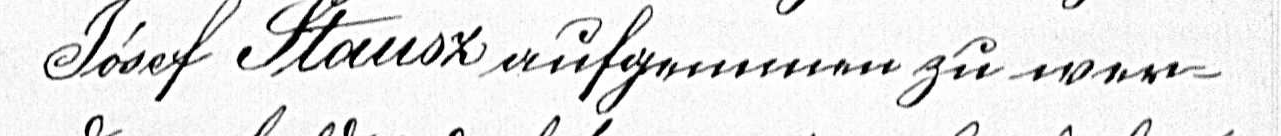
Jósef Stausz aufgemmen zu wer¬
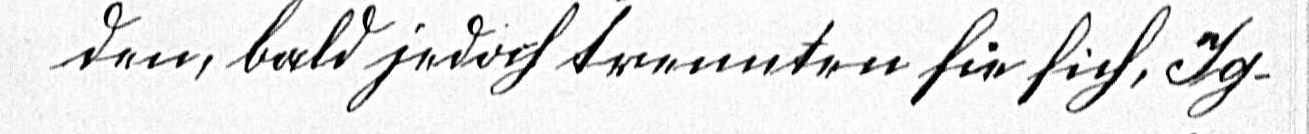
den, bald jedoch trennten sie sich, Jg¬
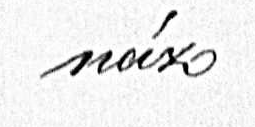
náz
